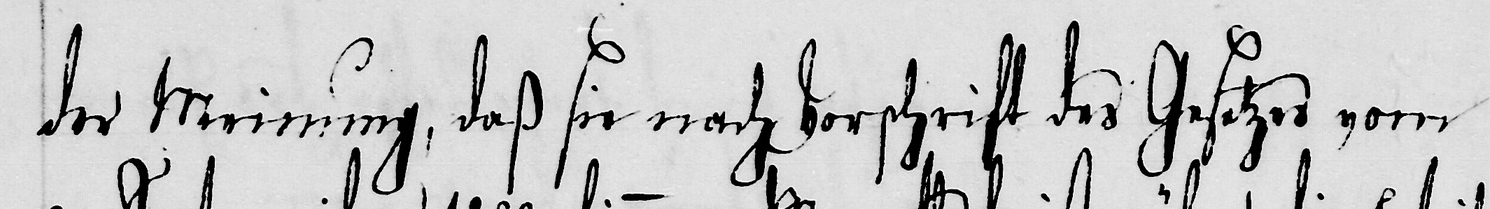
der Meinung, daß sie nach Vorschrift des Gesetzes vom
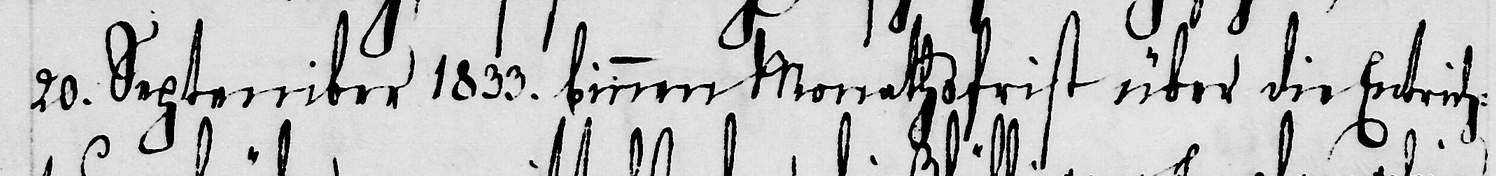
20. September 1833. binnen Monathsfrist über die Entric¬
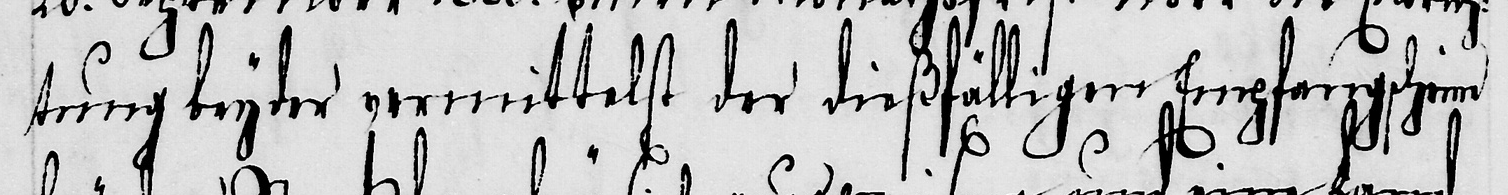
htung beyder vermittelst der dießfälligen Empfangsche¬
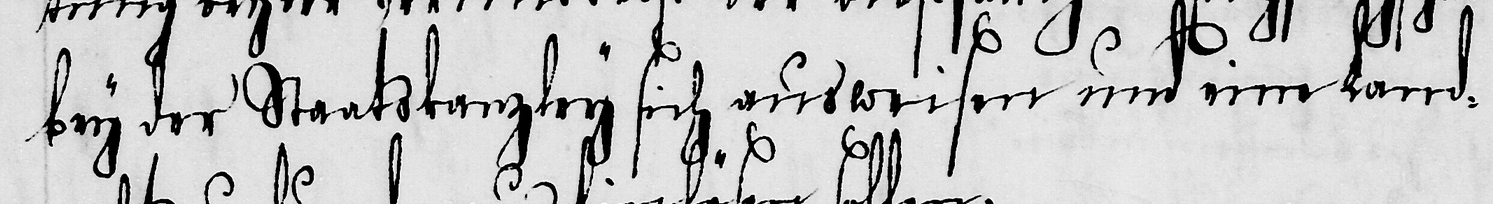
bey der Staatskanzley sich ausweisen und eine Land¬
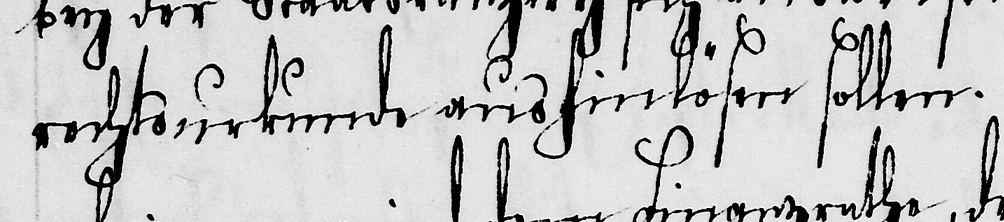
rechtsurkunde aushinlösen sollen.
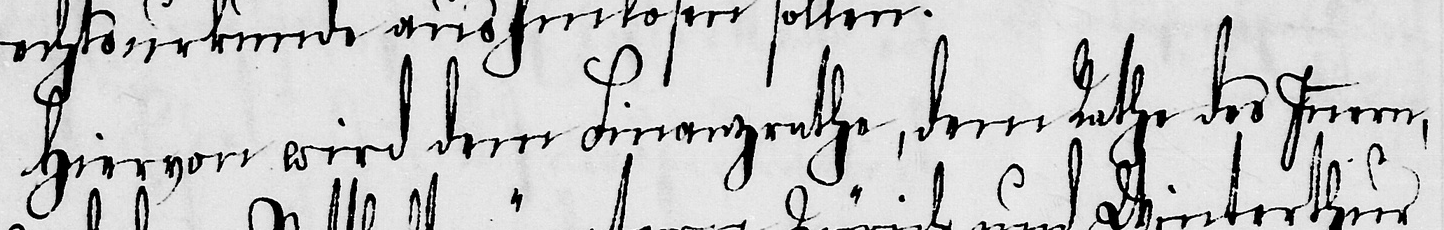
Hiervon wird dem Finanzrathe, dem Rathe des Innern
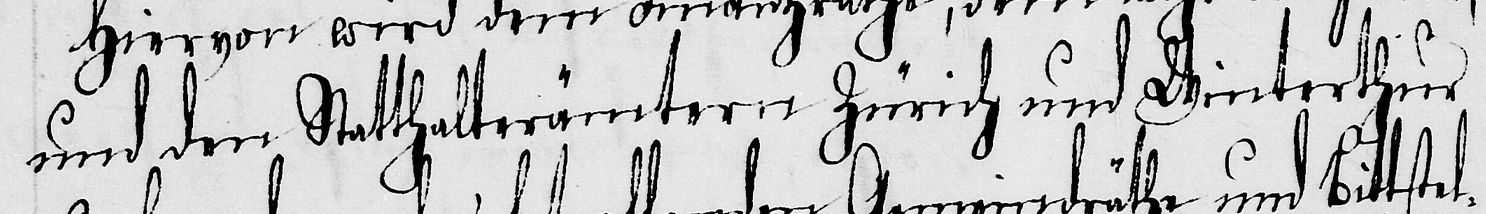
und den Statthalterämtern Zürich und Winterthur
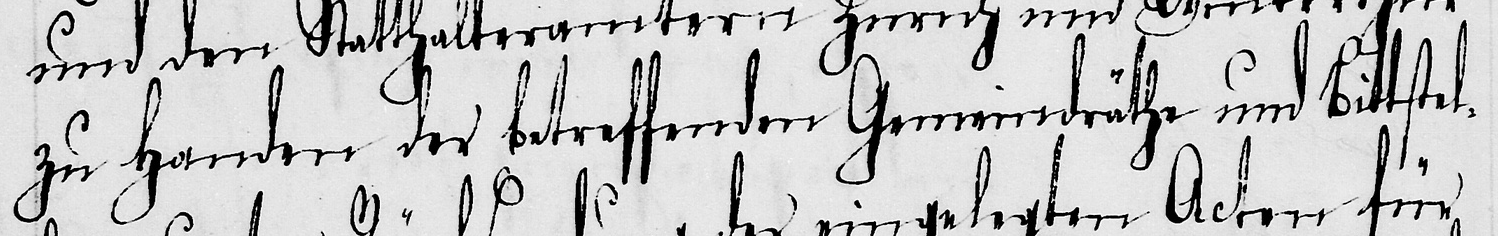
zu Handen der betreffenden Gemeindräthe und Bittst¬
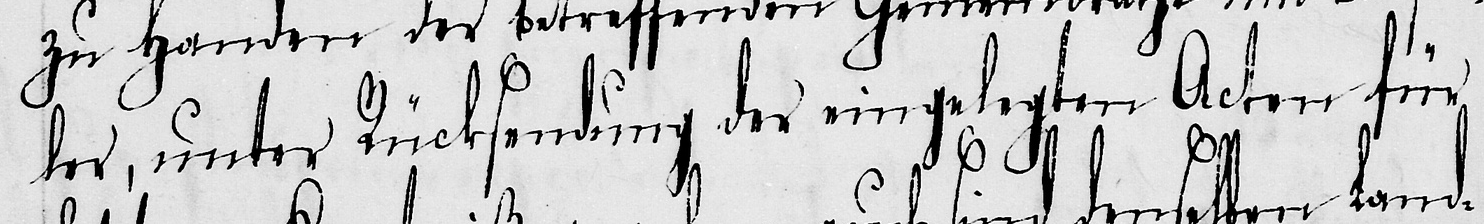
ler, unter Rücksendung der eingelegten Acten für
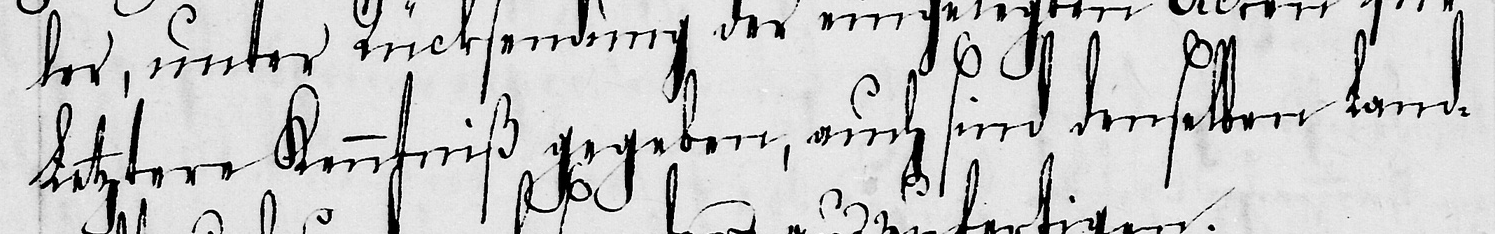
Letztere Kenntniß gegeben, auch sind denselben Land¬
